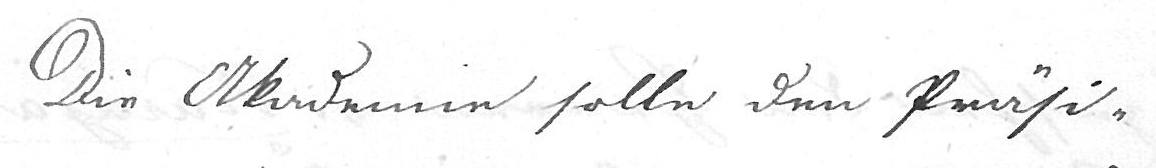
Die Akademie solle dem Präsi-
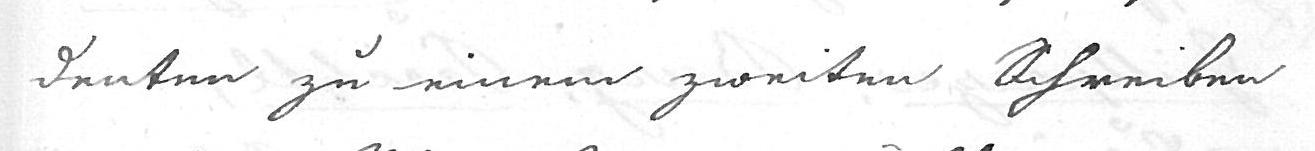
denten zu einem zweiten Schreiben
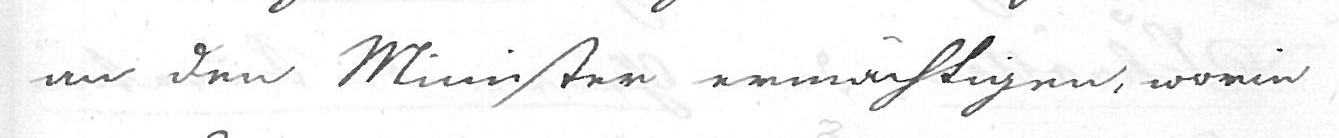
an den Minister ermächtigen, worin
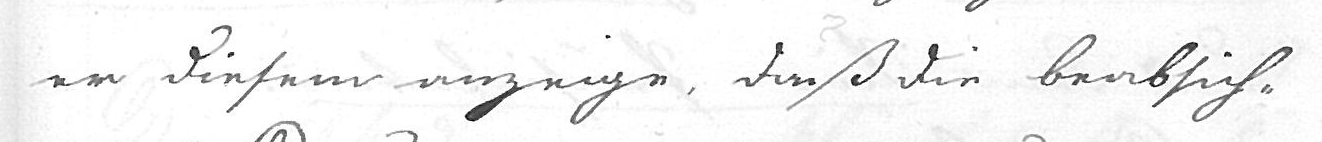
er diesem anzeige, daß die beabsich-
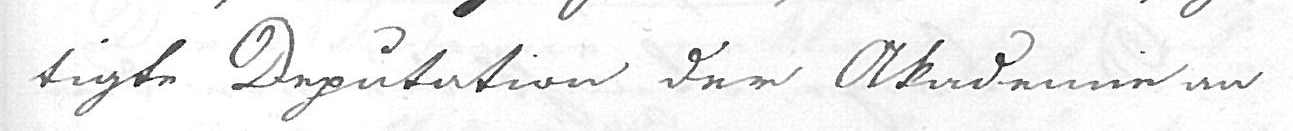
tigt Deputation der Akademie an
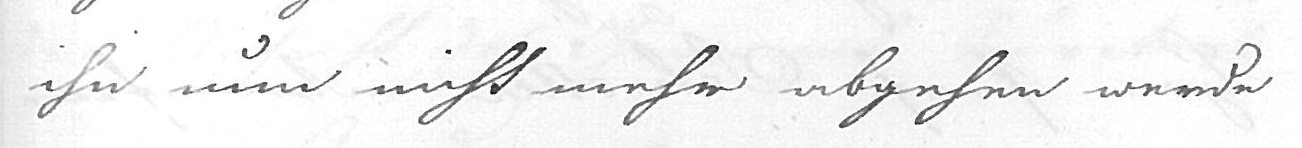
ihn nun nicht mehr abgehen werden
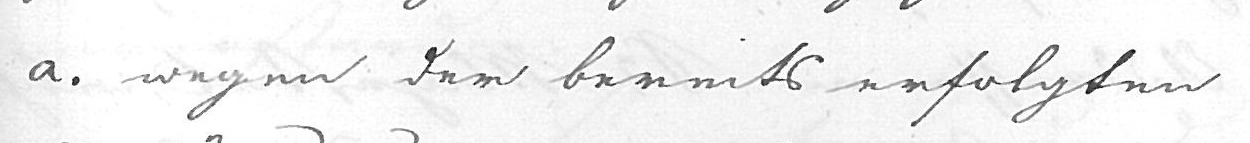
a. wegen der bereits erfolgten
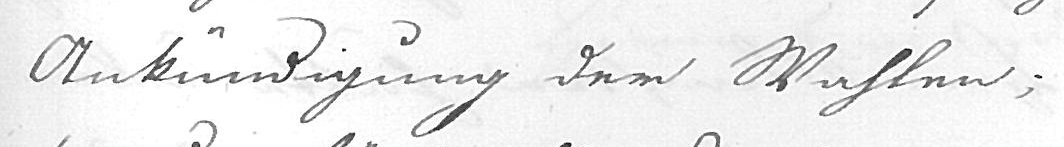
Ankündigung der Wahlen;
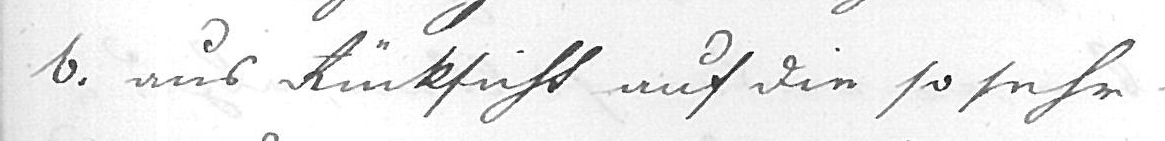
b. aus Rücksicht auf die so sehr in
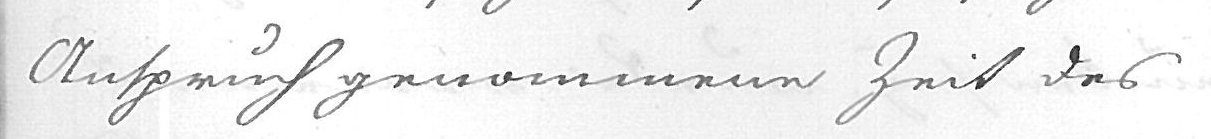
Anspruch genommene Zeit des
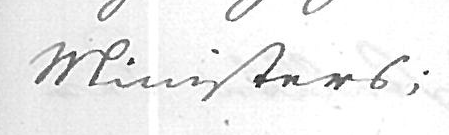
Minister;
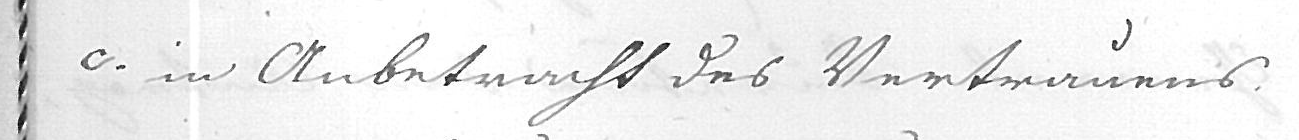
c. in Anbetracht des Vertrauens,
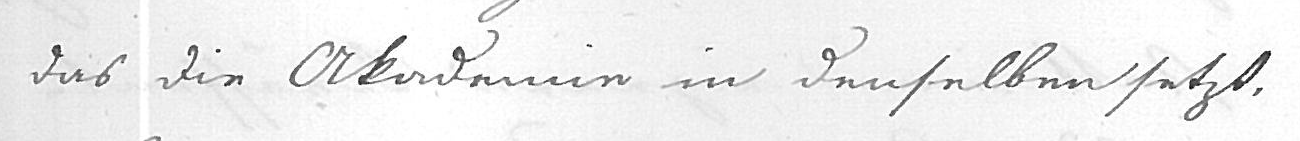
das die Akademie in denselben setzt,
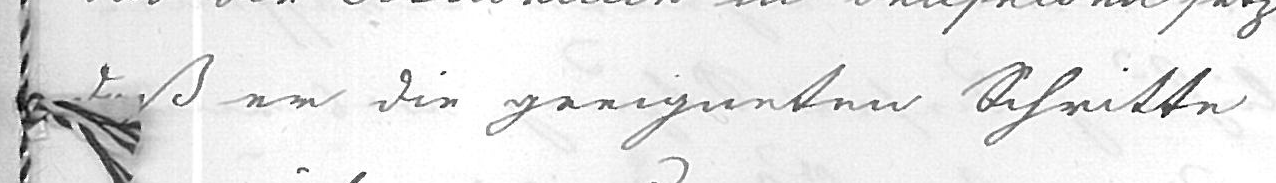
daß er die geeigneten Schritte
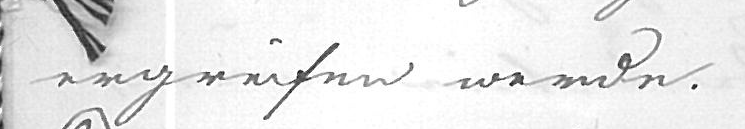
ergreifen werde.
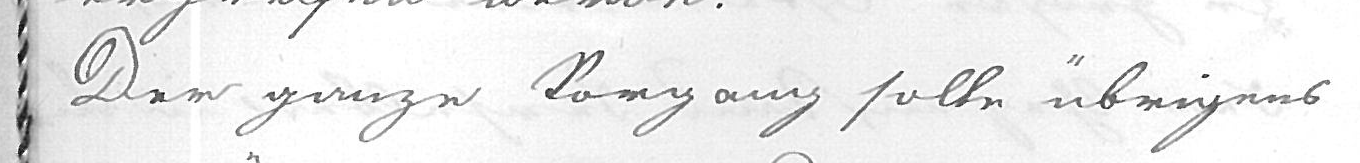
Der ganze Vorgang solle übrigens
